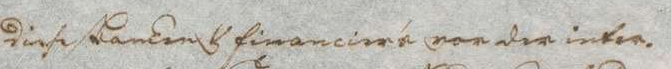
diese Banken & Financier's vor der inter-
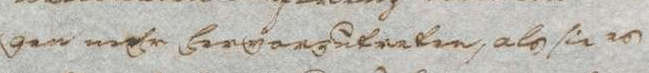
gen mehr hervorzutreten, als sie es
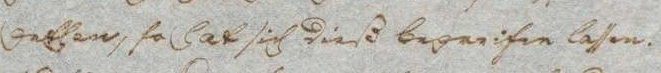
gethan, so hat sich dieß begreifen lassen.
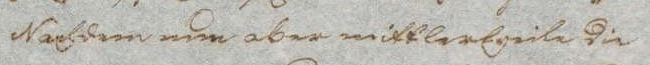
Nachdem nun aber mittlerweile die
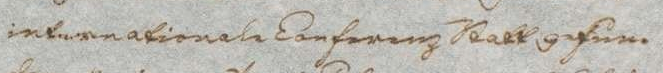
internatinale Conferenz statt gefun-
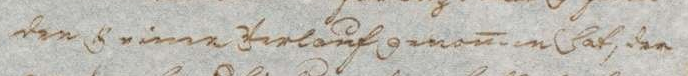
den & einen Verlauf genommen hat, der
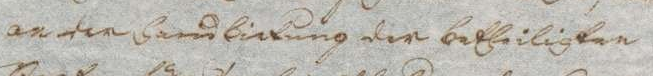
an der Handbietung der betheiligten
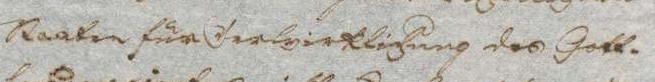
Staaten für Verwirklichung des Gott-
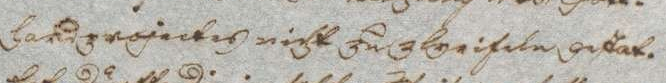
hardprojectes nicht zu zweifeln gestat-
